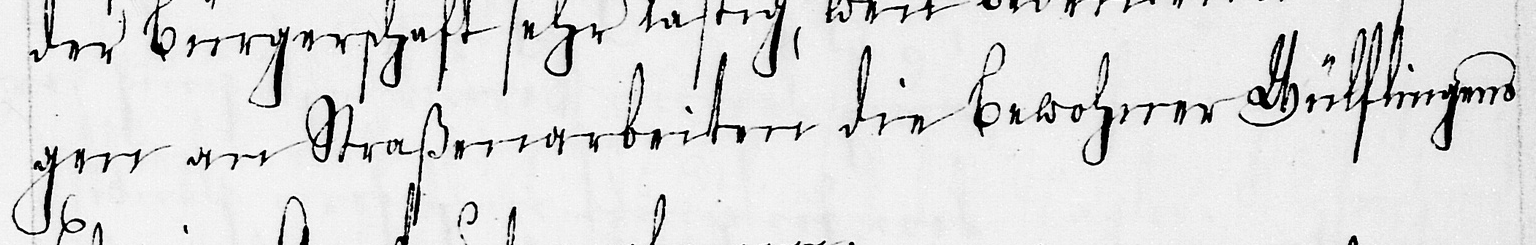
gen an Straßenarbeiten die Bewohner Wülflingens
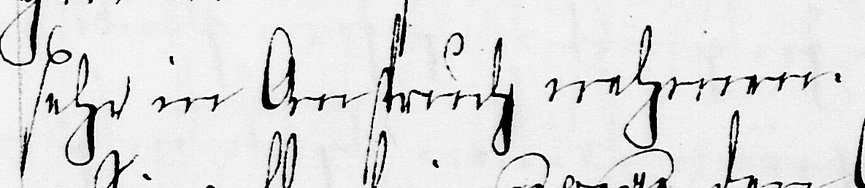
sehr in Anspruch nehmen.
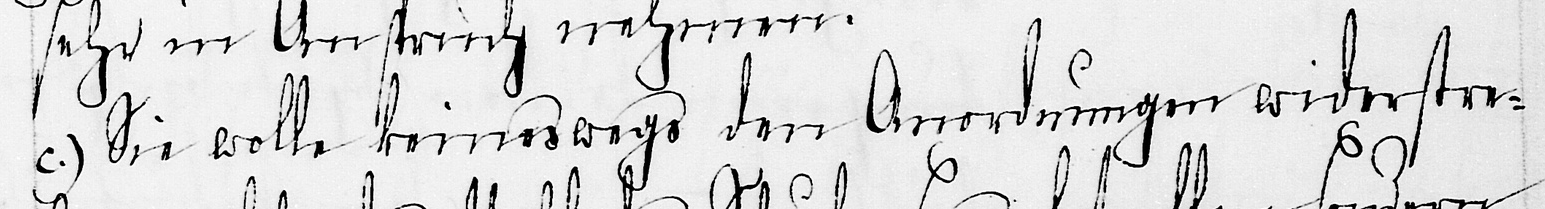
c.) Sie wolle keineswegs den Anordnungen widerstre¬
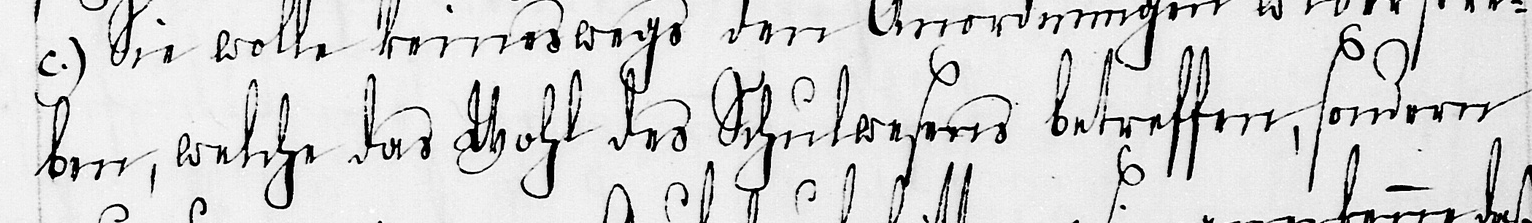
ben, welche das Wohl des Schulwesens betreffen, sondern
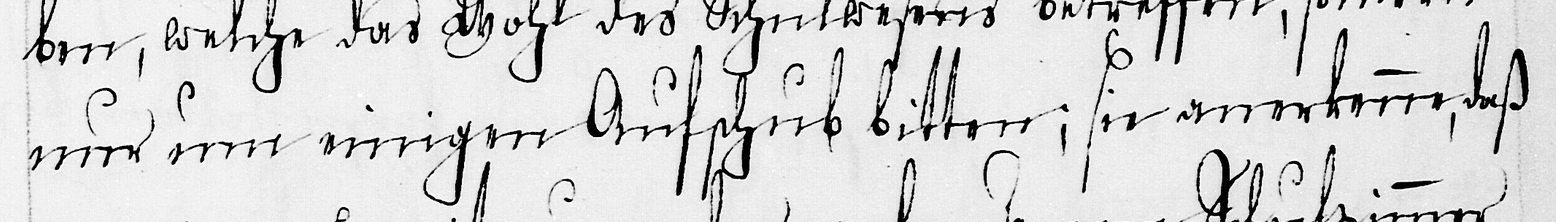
nur um einigen Aufschub bitten; sie anerkenne, daß
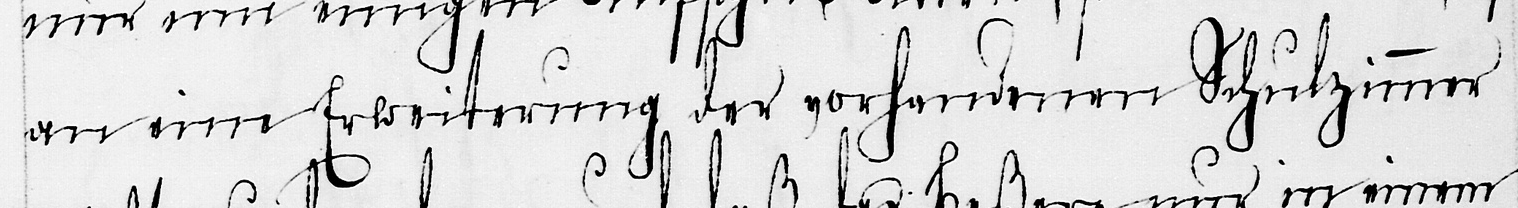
an eine Erweiterung der vorhandenen Schulzimmer
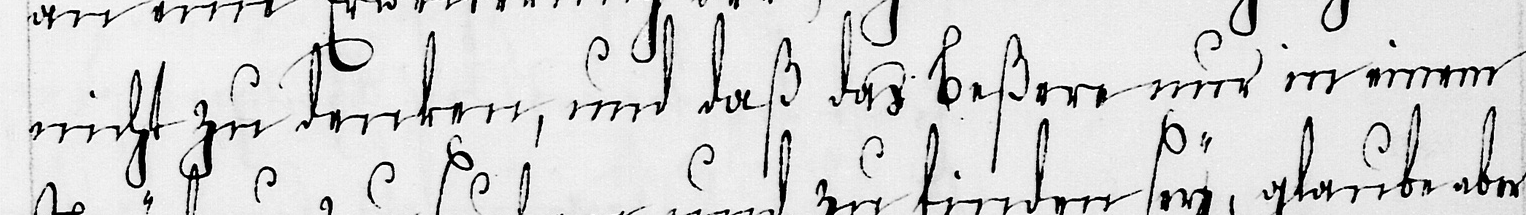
nicht zu denken, und daß das Beßere nur in einem
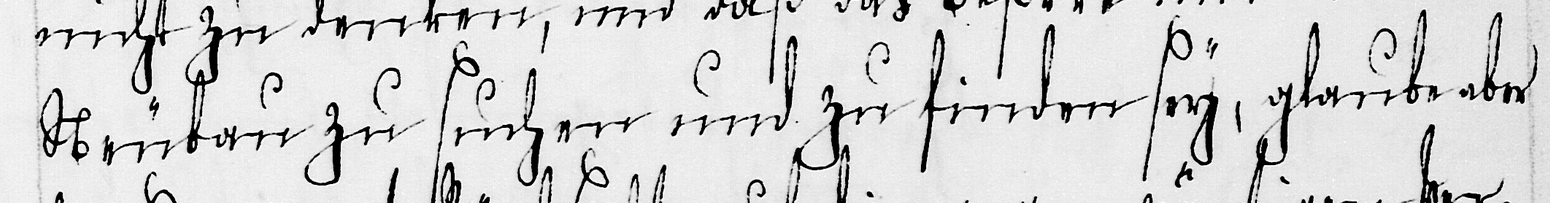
Neubau zu suchen und zu finden sey, glaube aber
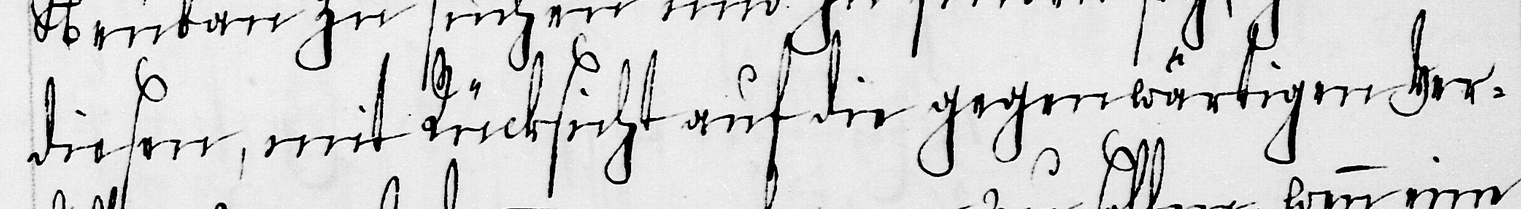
diesen, mit Rücksicht auf die gegenwärtigen Ver¬
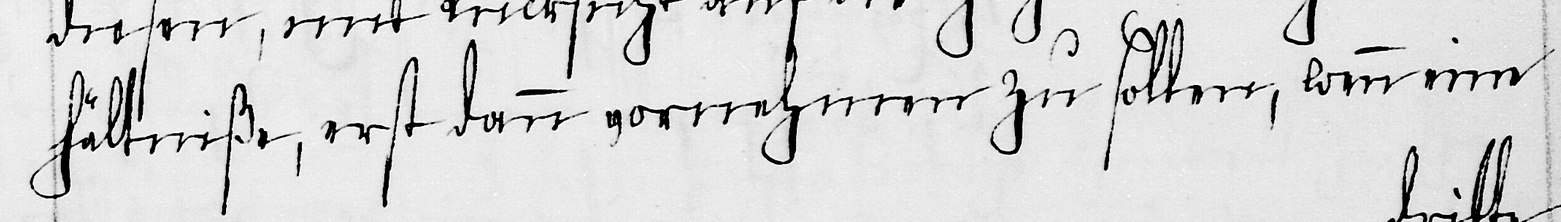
hältniße, erst dann vornehmen zu sollen, wenn eine
